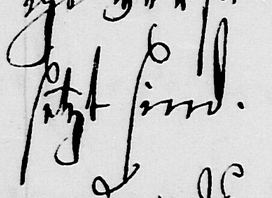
tzt sind.
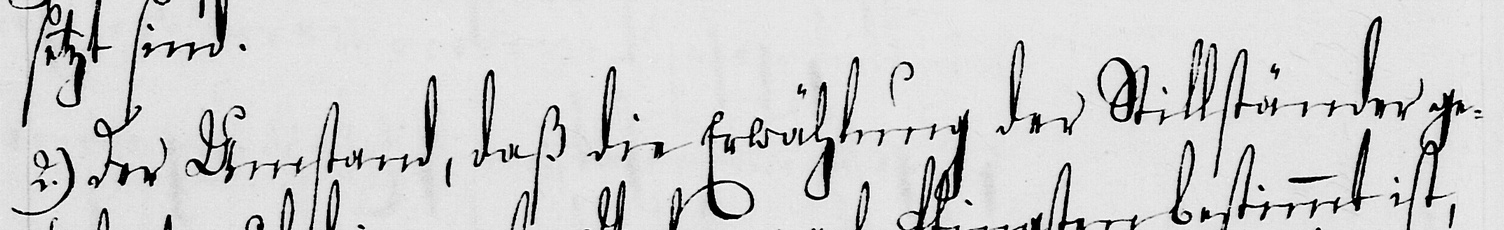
2.) Der Umstand, daß die Erwählung der Stillständer ge¬
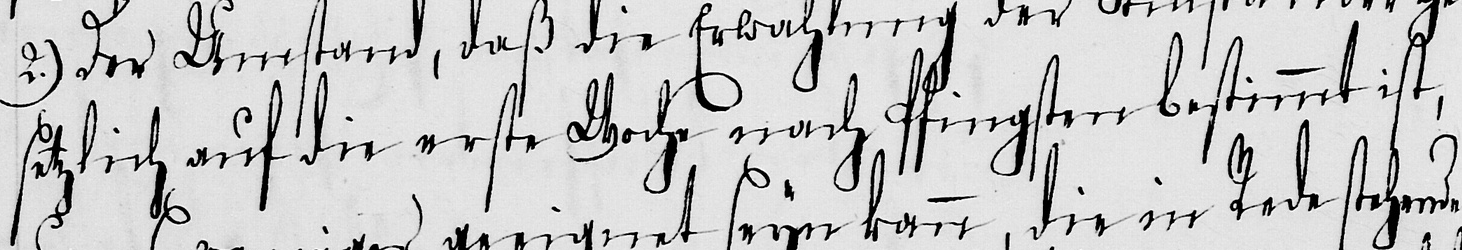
etzlich auf die erste Woche nach Pfingsten bestimmt ist,
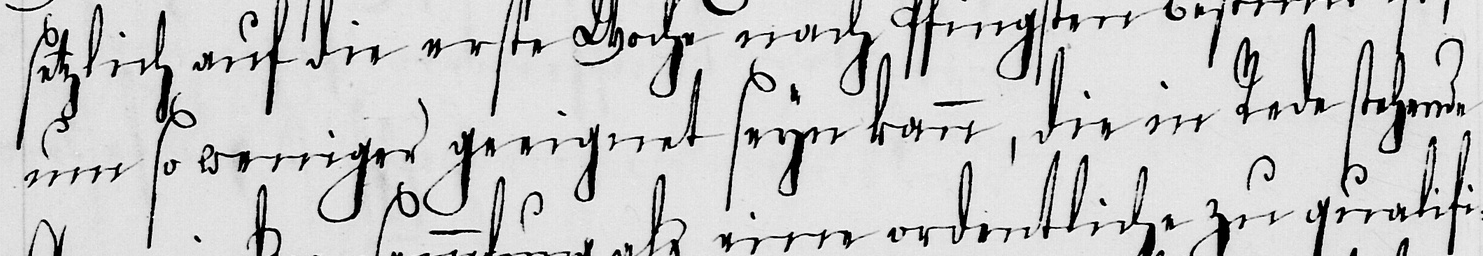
um so weniger geeignet seyn kann, die in Rede stehende
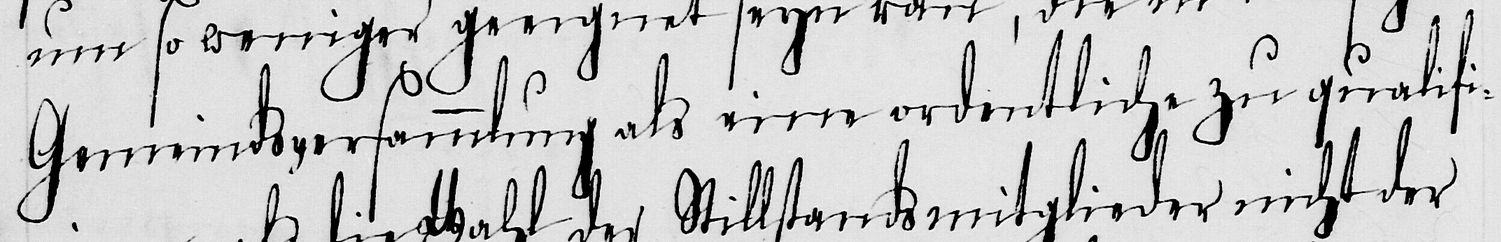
Gemeindsversammlung als eine ordentliche zu qualifi¬
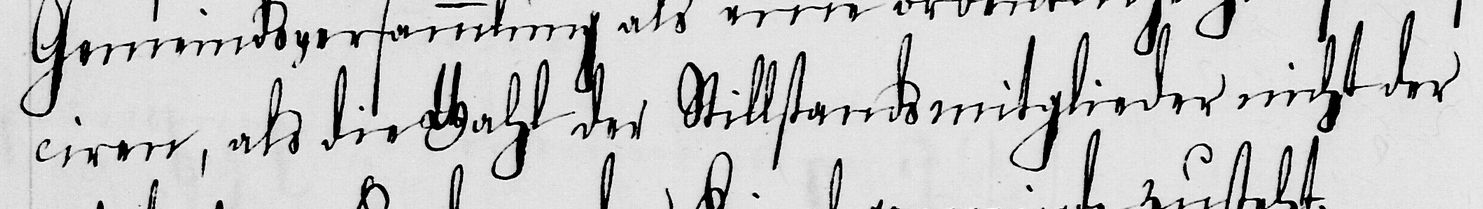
ziren, als die Wahl der Stillstandsmitglieder nicht der
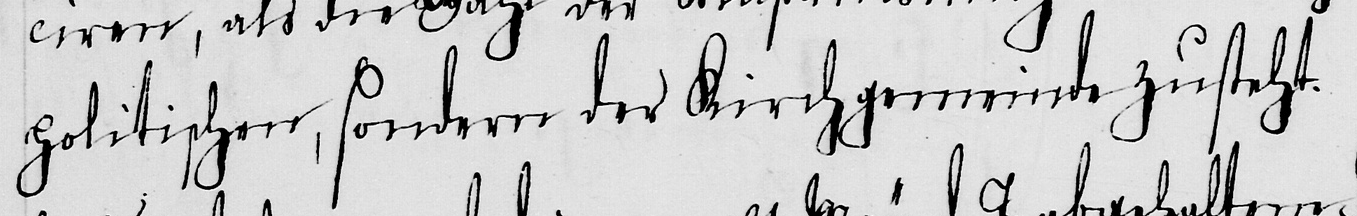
politischen, sondern der Kirchgemeinde zusteht.
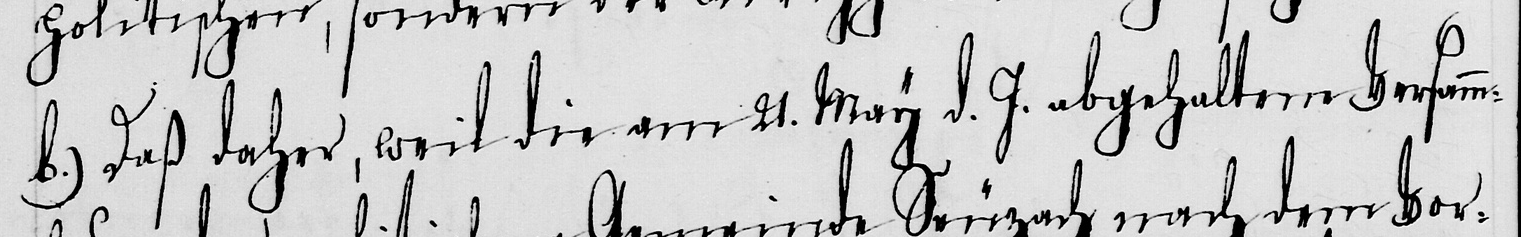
b.) Daß daher, weil die am 21. May d. J. abgehaltene Versam¬
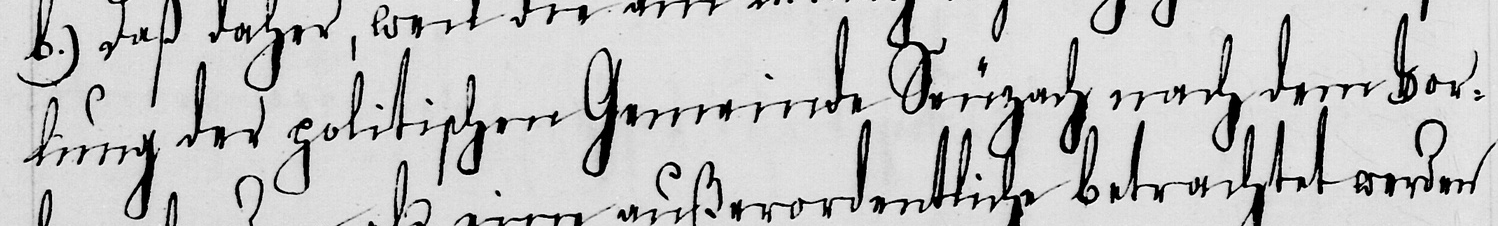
mlung der politischen Gemeinde Seuzach nach dem Vor¬
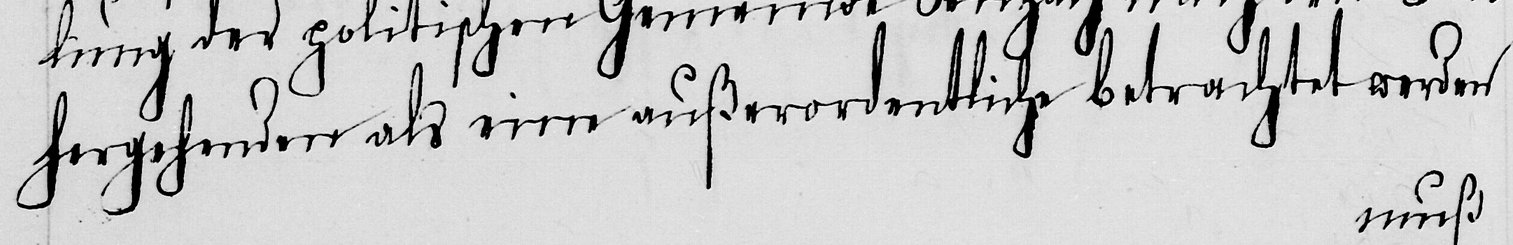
hergehenden als eine außerordentliche betrachtet werden
